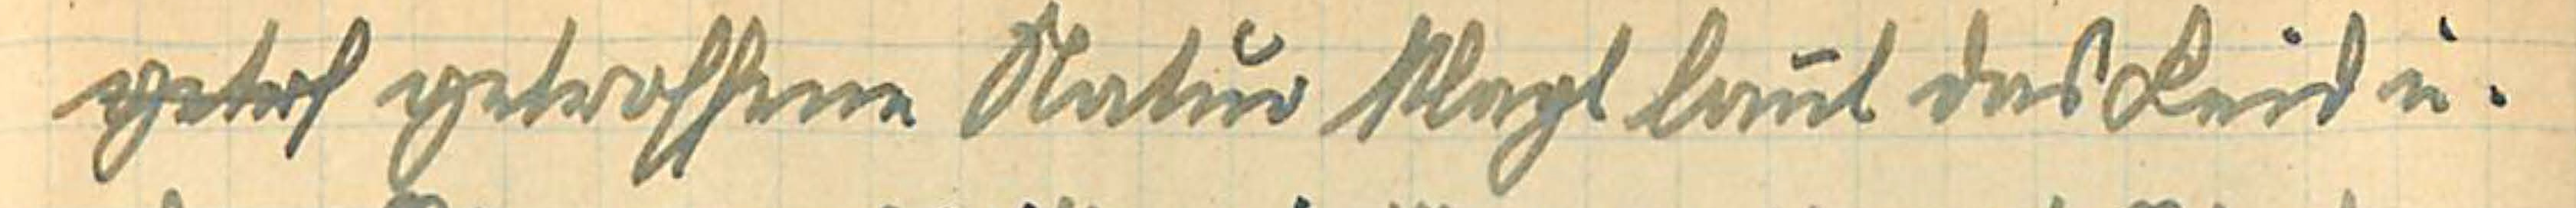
getrf getroffene Natur klagt laut das Leid u.
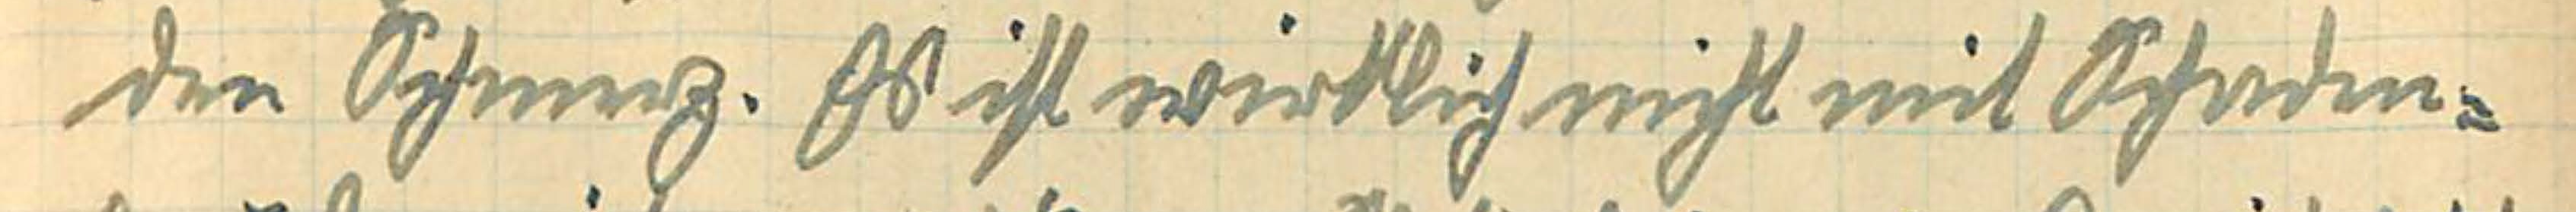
den Schmerz. Es ist wirklich nicht mit Schaden-
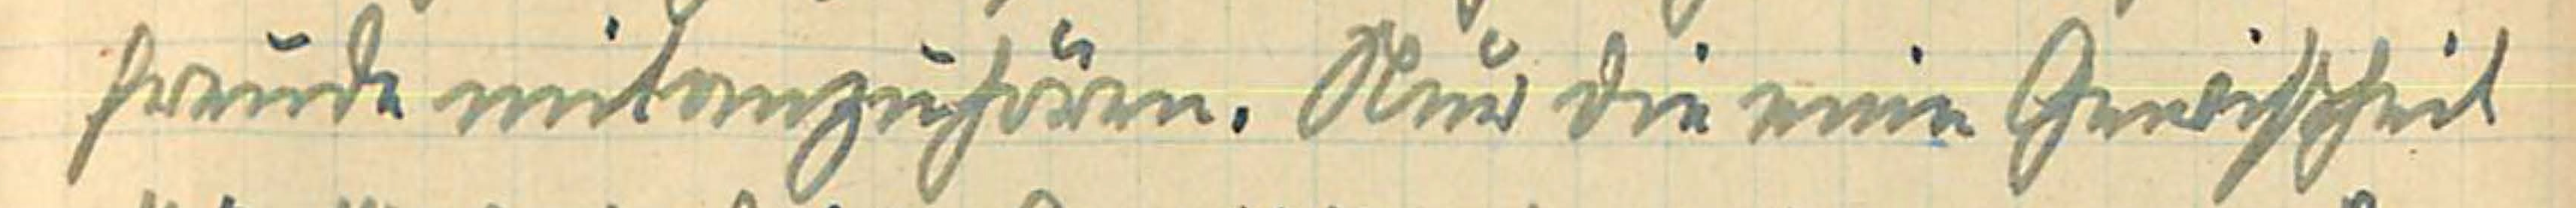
freude mitanzuhören. Nur die eine Gewißheit
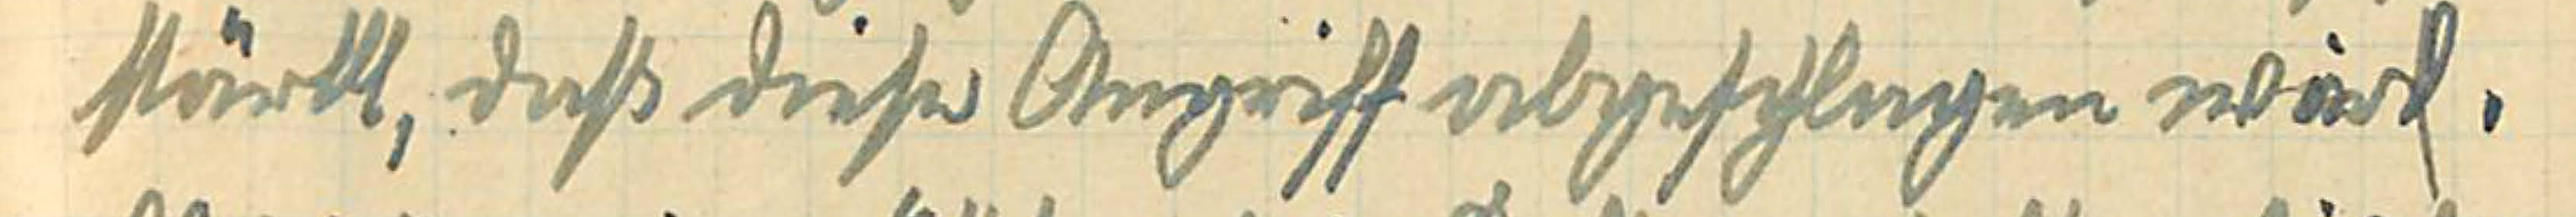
stärkt, daß dieser Angriff abgeschlagen ward.
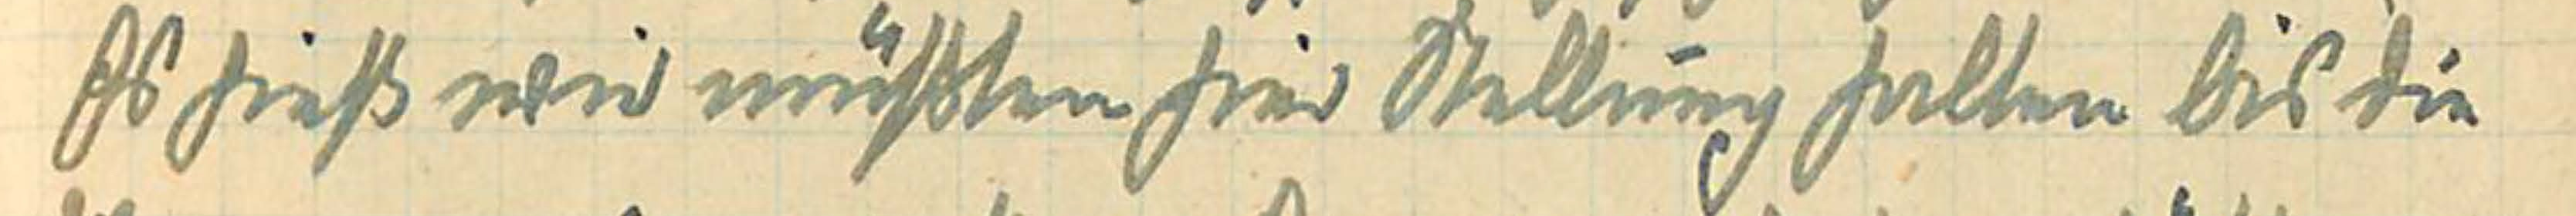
Es hieß wir müßten hier Stellung halten bis die
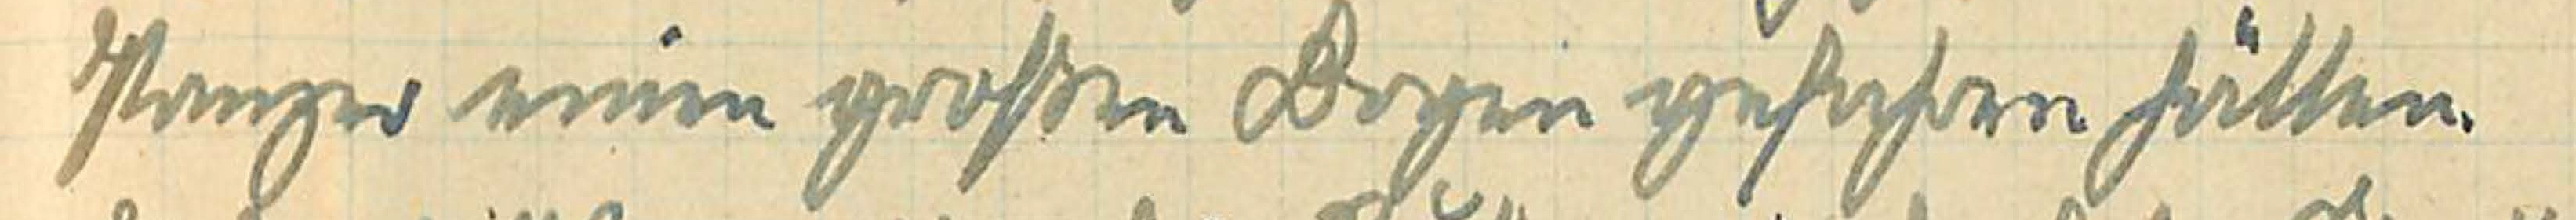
Panzer einen großen Bogen gefahren hätten.
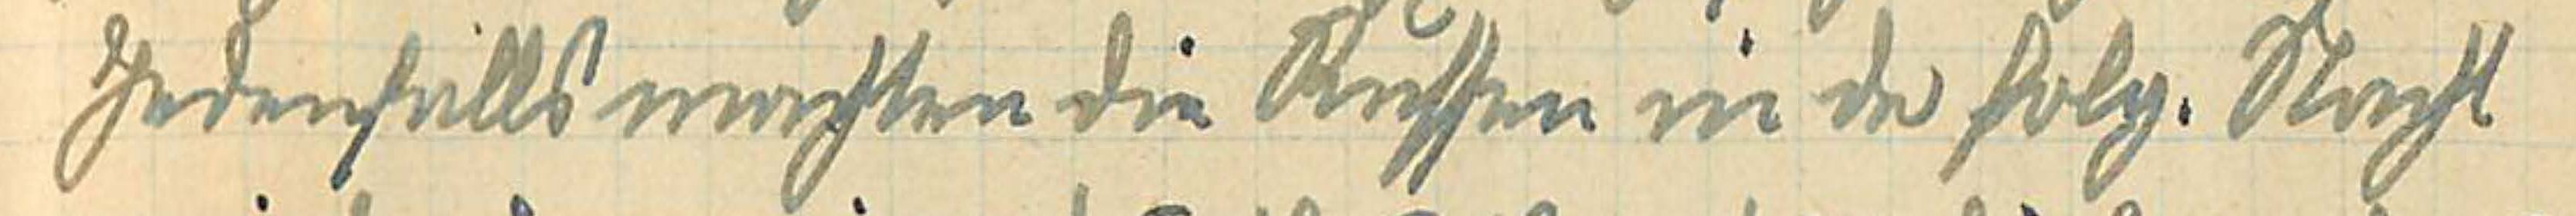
Jedenfalls machten die Russen in der folg. Nacht
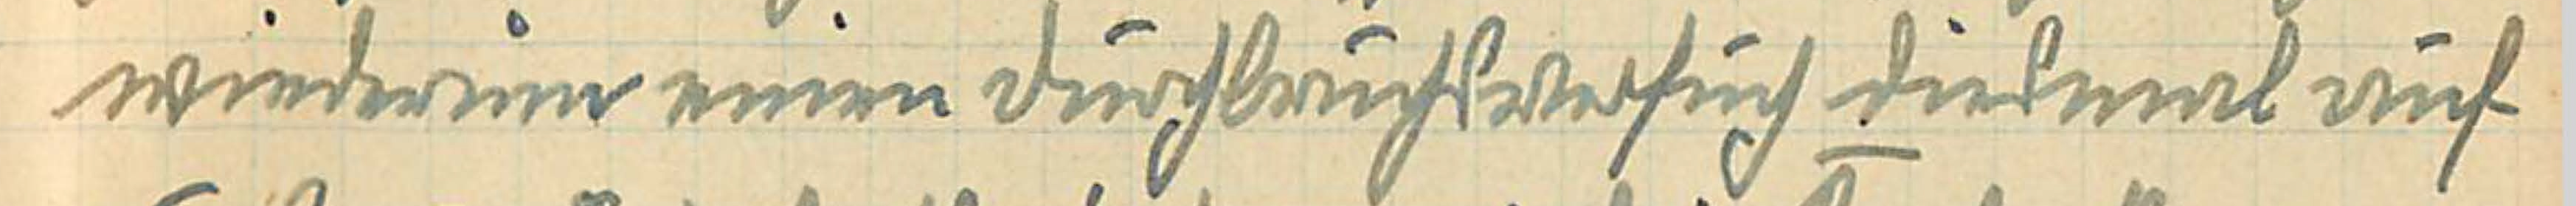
wiederum einen Durchbruchsversuch diesmal auf
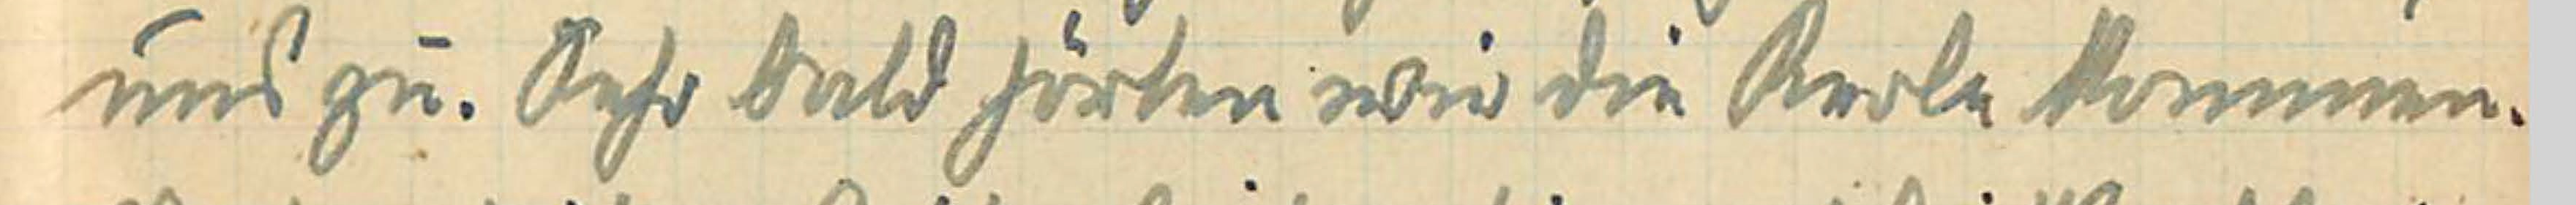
uns zu. Sehr bald hörten wir die Kerle kommen.
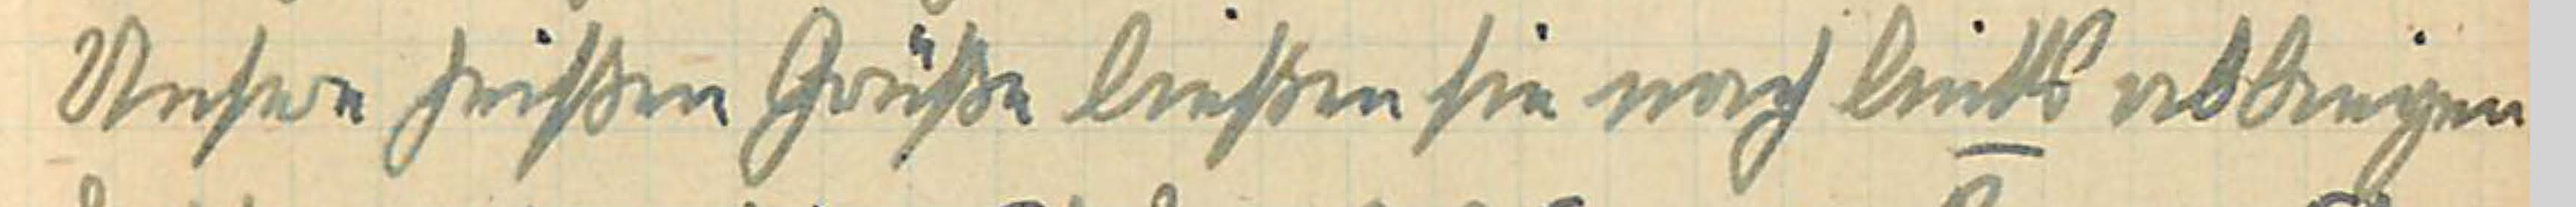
Unsere heißen Grüße ließen sie nach links abbiegen.
